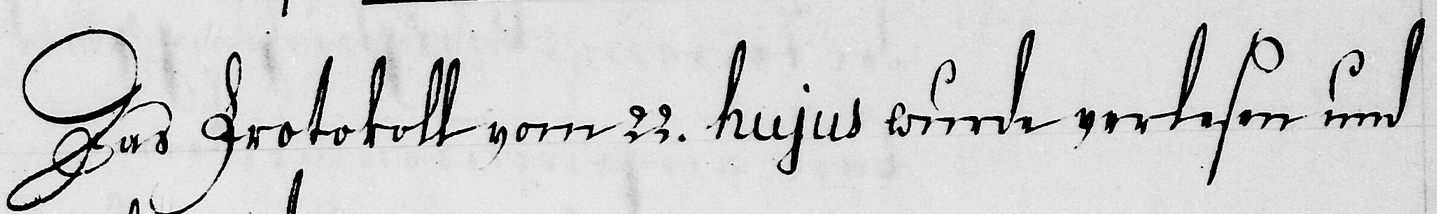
Das Protokoll vom 22. hujus wurde verlesen und
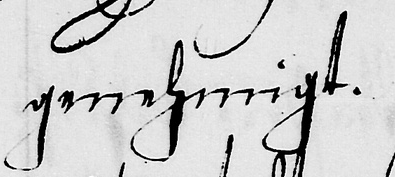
genehmigt.
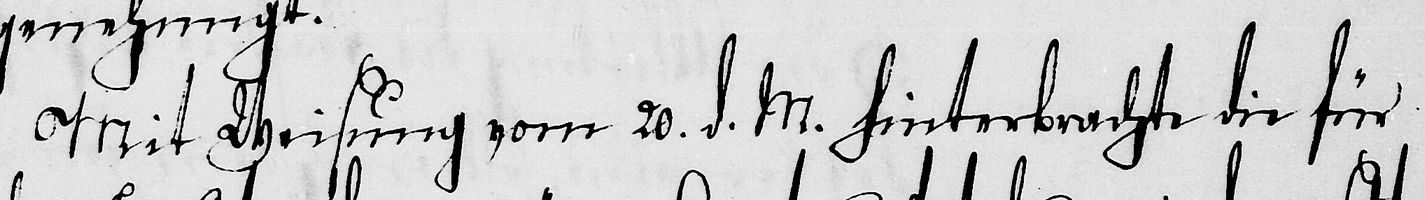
Mit Weisung vom 20. d. M. hinterbrachte die für
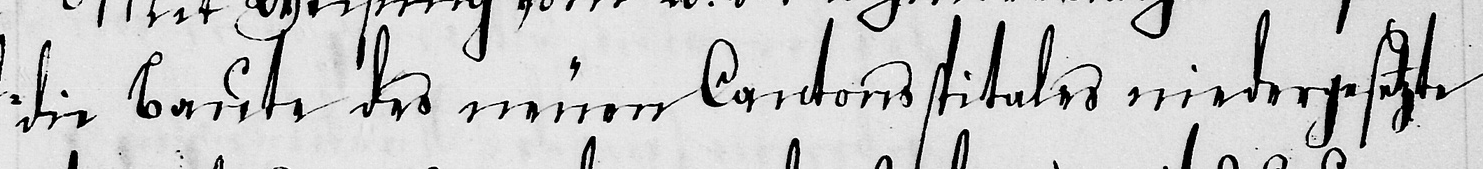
die Baute des neuen Cantonsspitales niedergesetzte
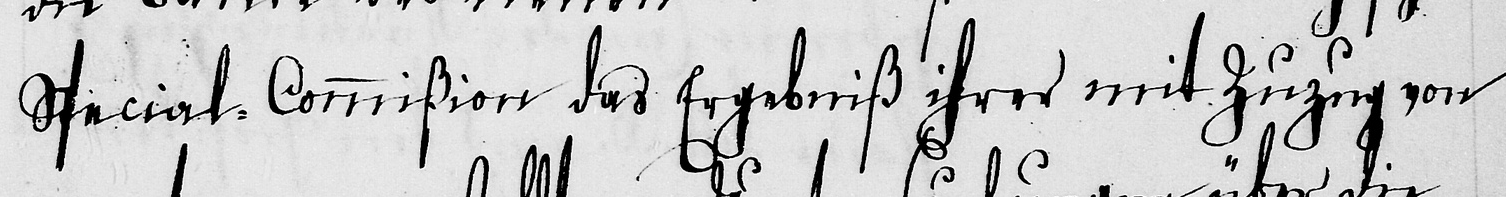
Special-Commißion das Ergebniß ihrer mit Zuzug von
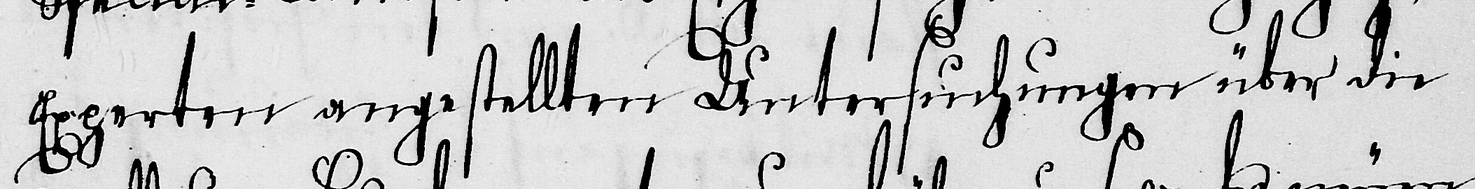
Experten angestellten Untersuchungen über die
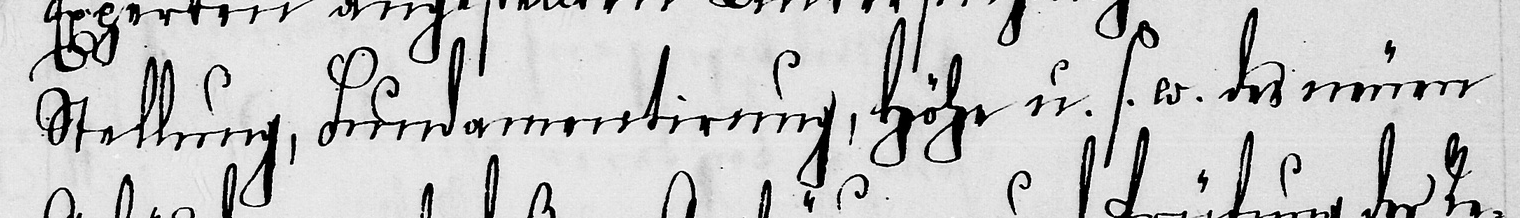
Stellung, Fundamentierung, Höhe u. s. w. des neuen
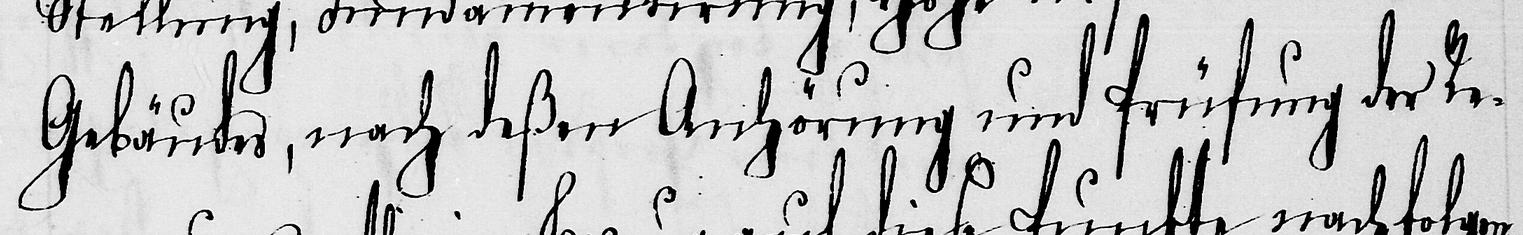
Gebäudes, nach deßen Anhörung und Prüfung der Re¬
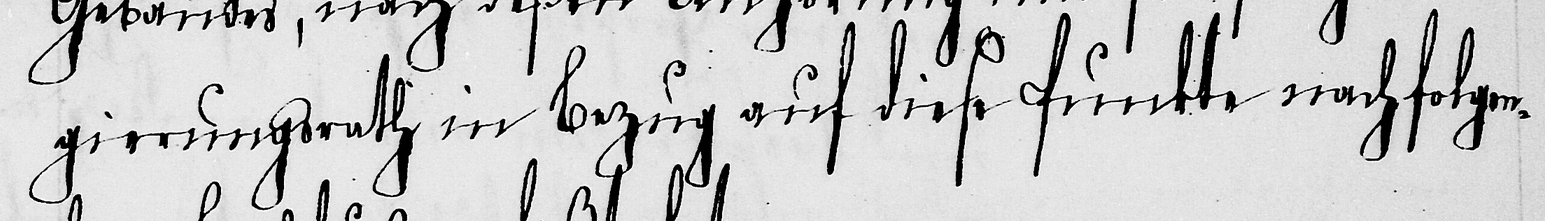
gierungsrath in Bezug auf diese Punkte nachfolge¬
